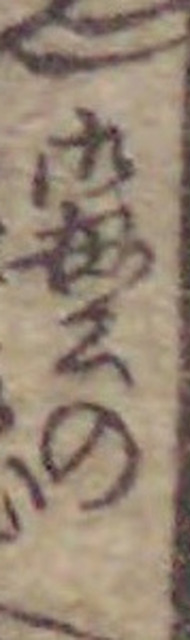御母上の
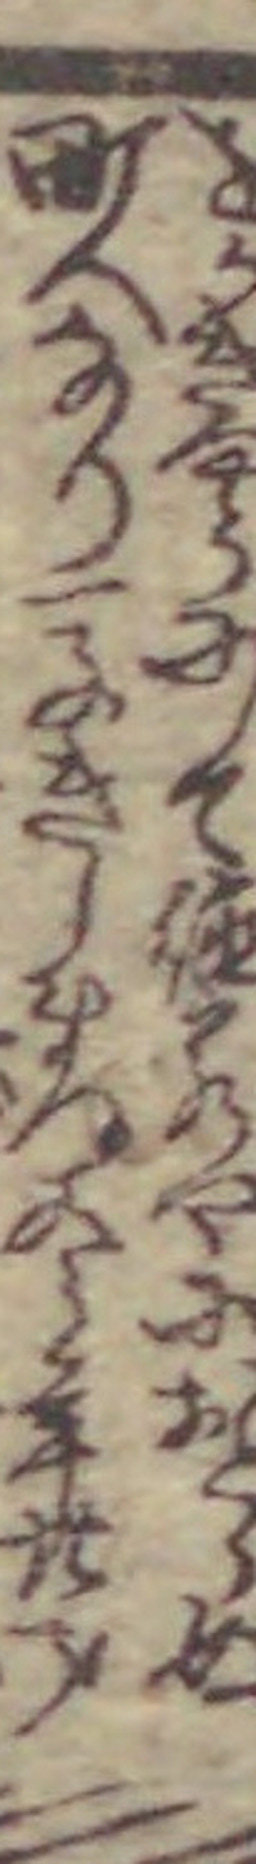町人なり一子きしまつた？う年廿才
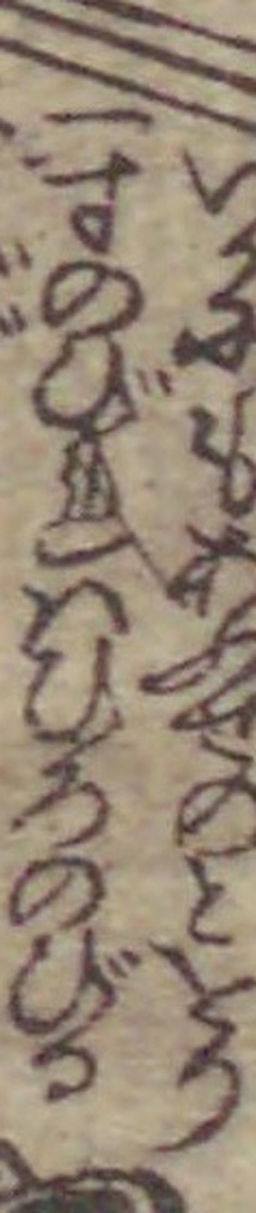一寸のびれはひろのびる
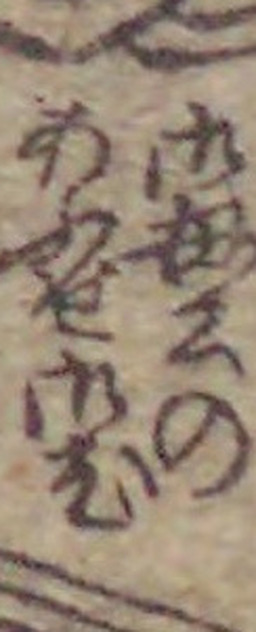あふせ御尤
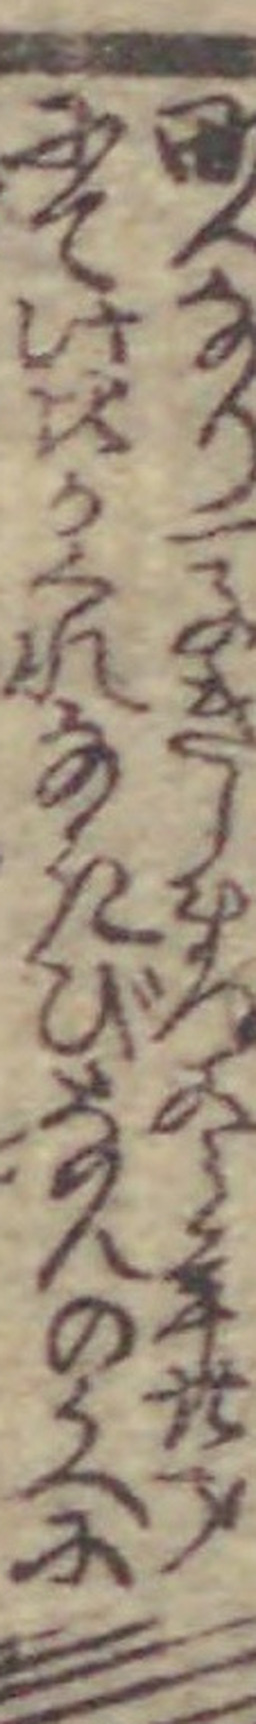にて此頃かくれなきびなんのうへに
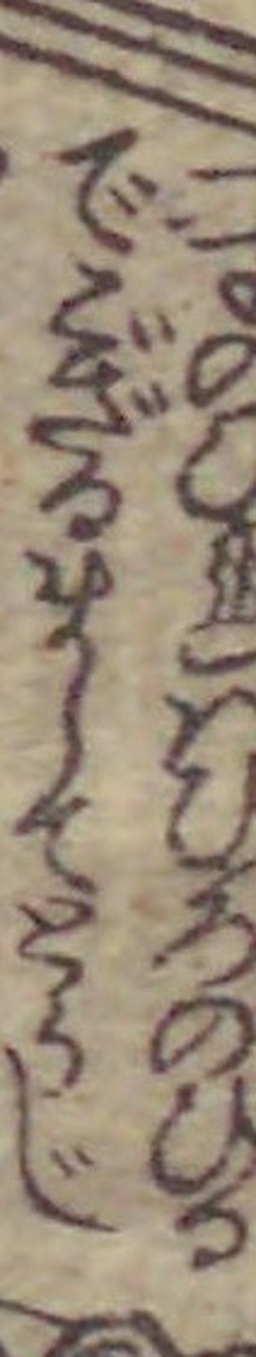でござるましてとうじ
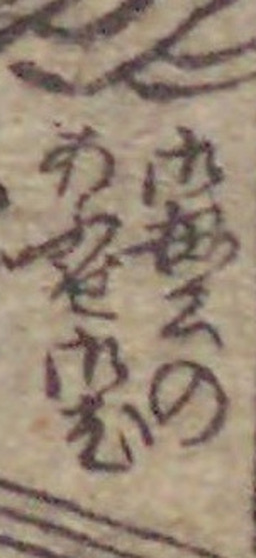あふせ御尤
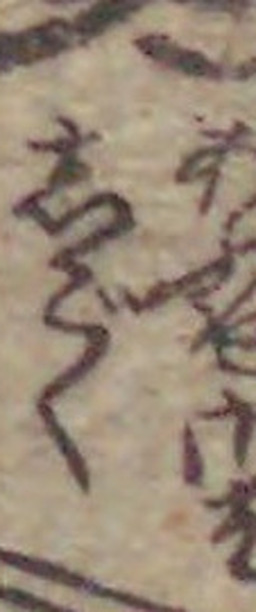しごく
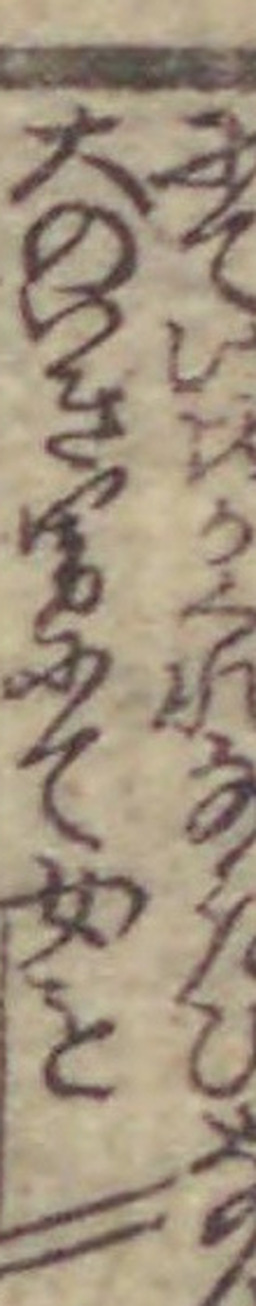大のいき男にて女を
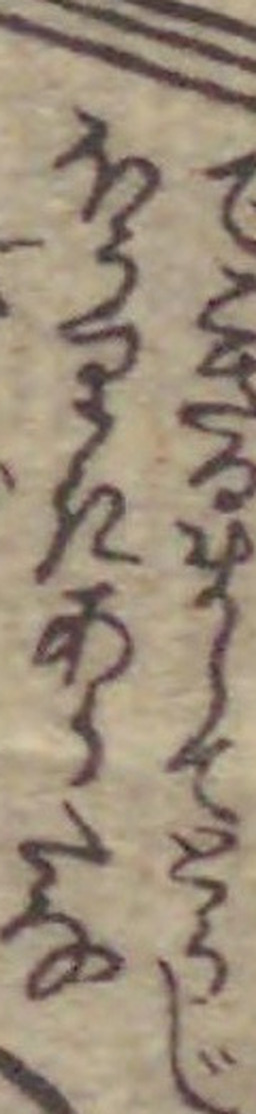ほうりきあらたかな
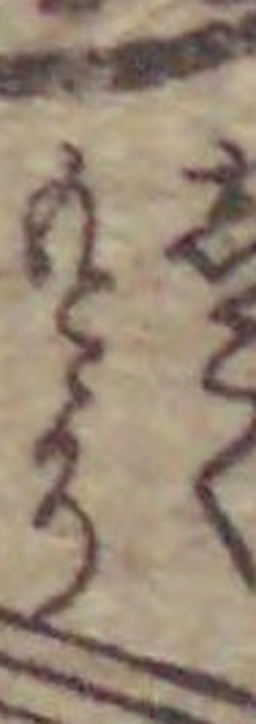もとより
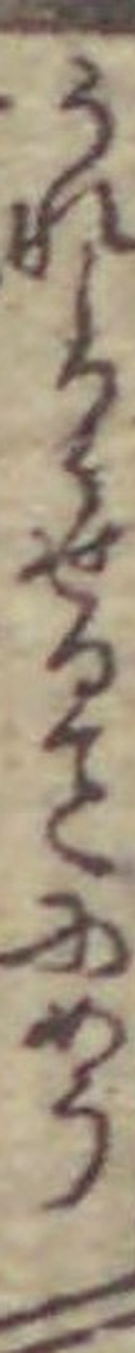うれしからせることにめう
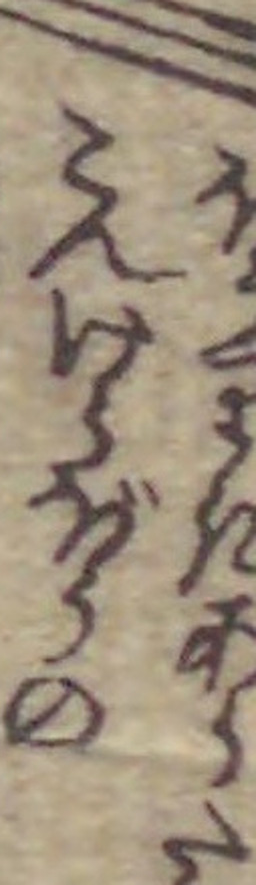こんけらぼうの
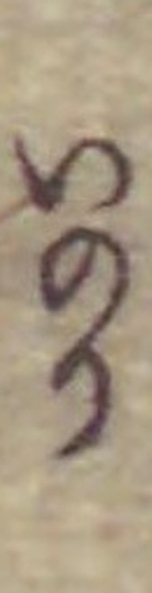いのり
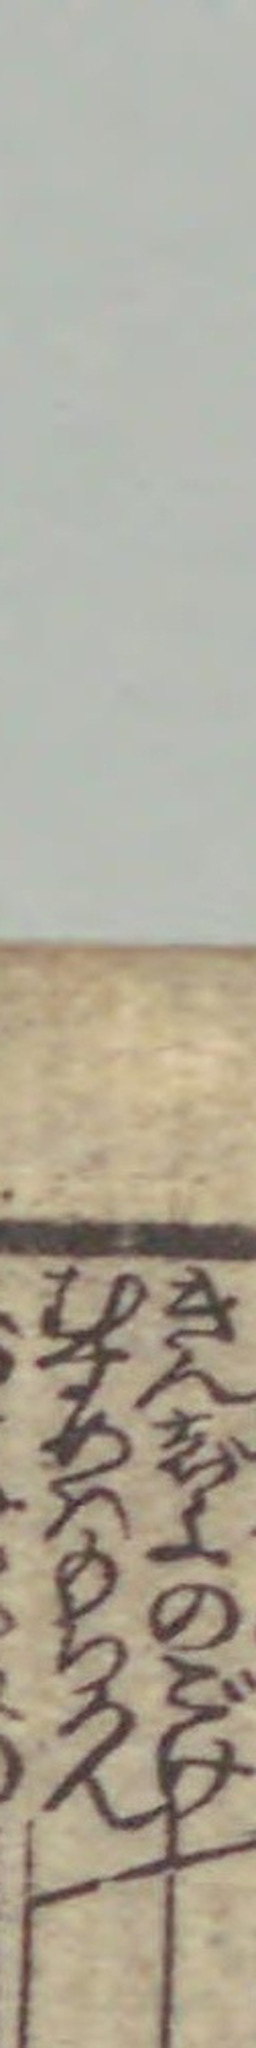むすめはもちろん
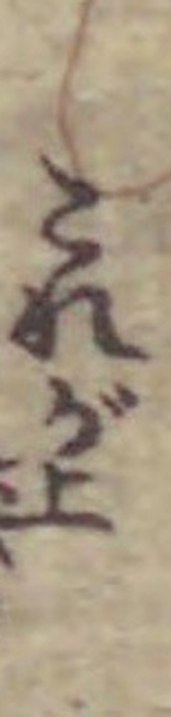これが上
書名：止而道致虚録 3巻
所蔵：国立国会図書館 National Diet Library, JAPAN
